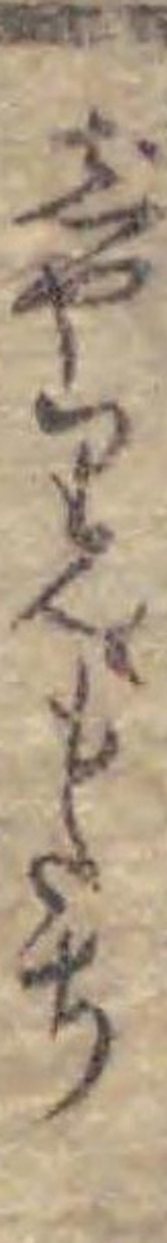じやりんもたち
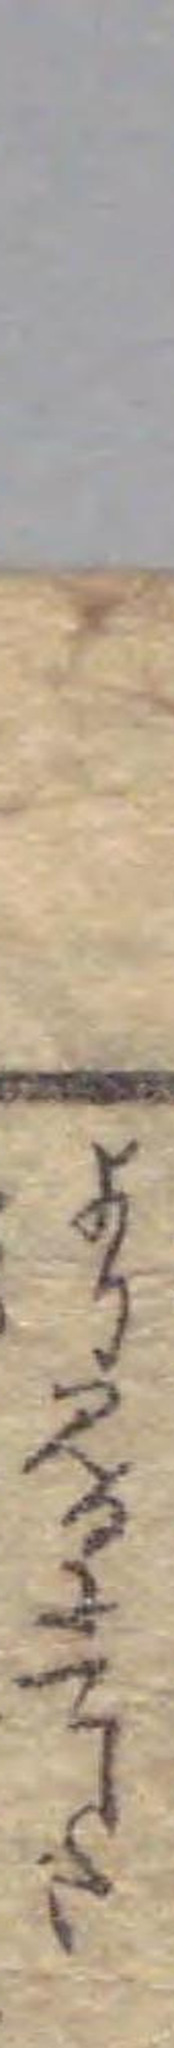より見るにてした
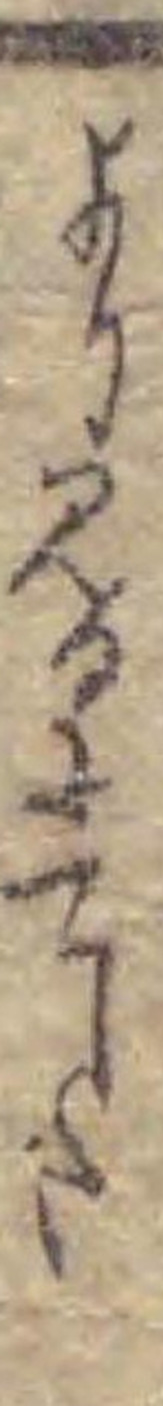より見るにてした
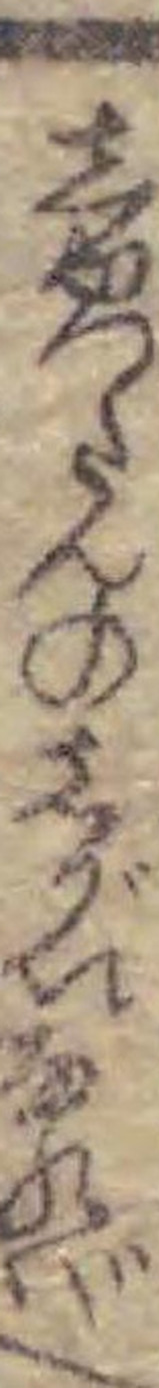しゆつたんのしがいなれば
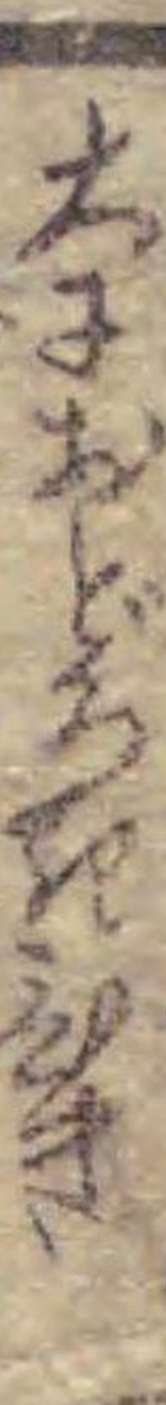大におどろきひき
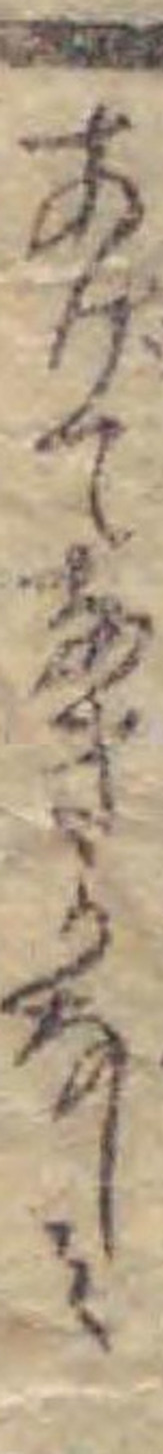あげてなきかなしみ
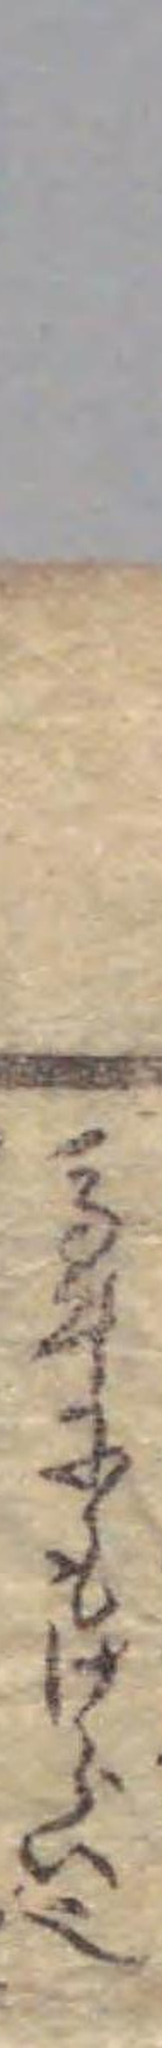馬斗にもけらい也
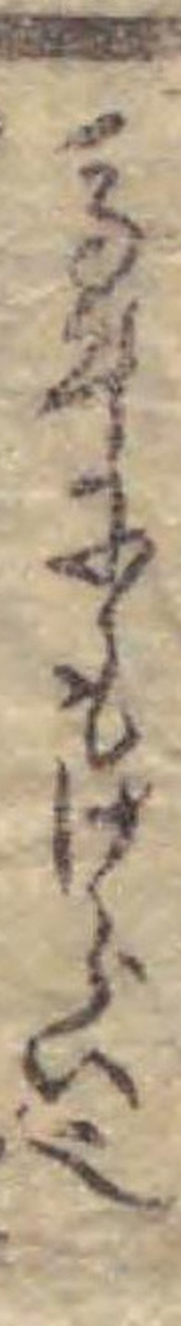馬斗にもけらい也
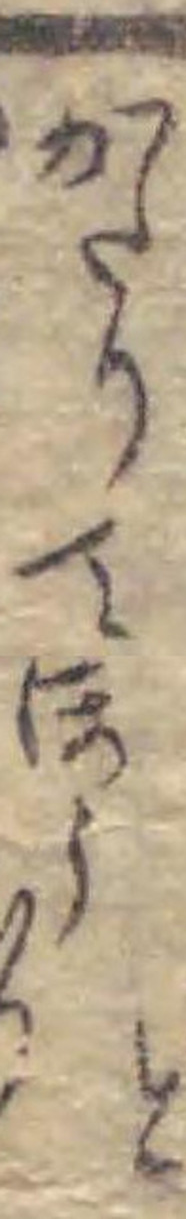かたりてほう
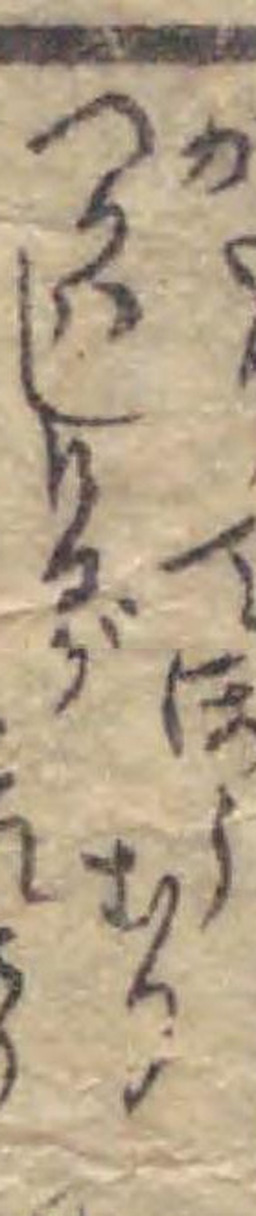つかはしけるが
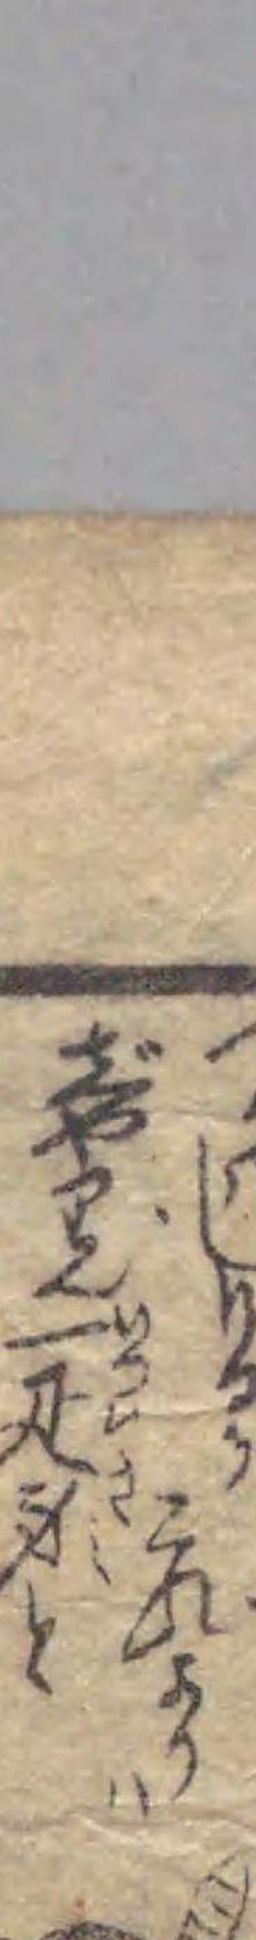じやりん一疋身と
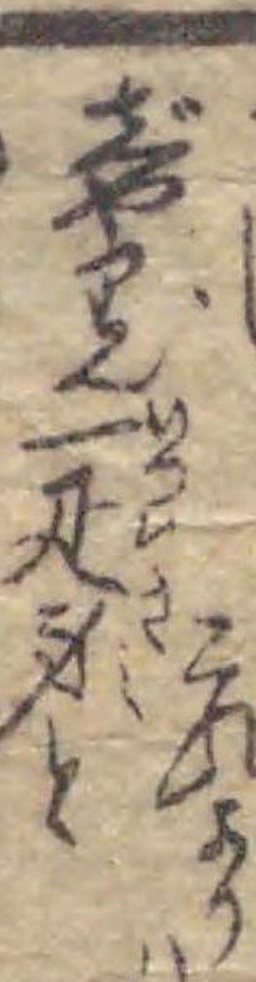じやりん一疋身と
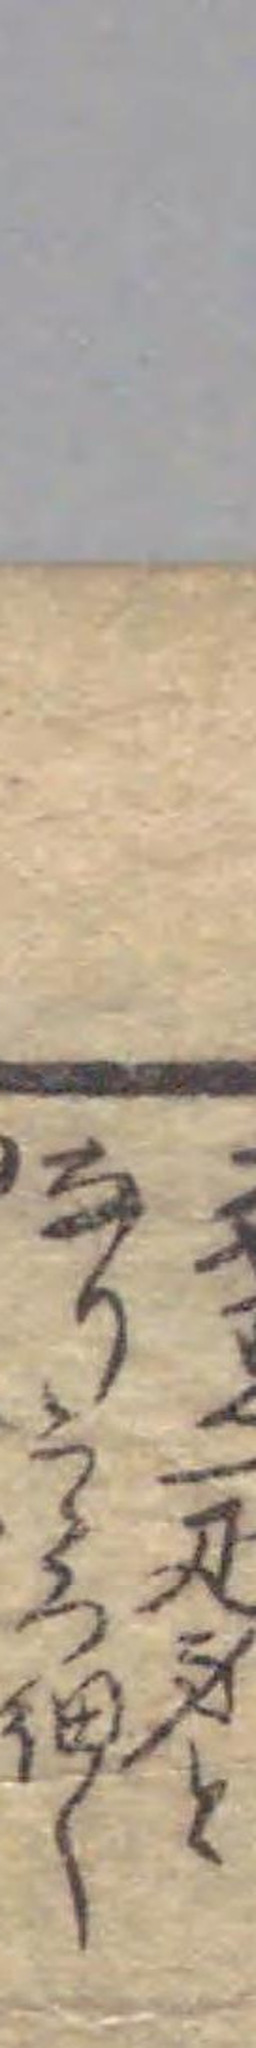なりこゝろ細く
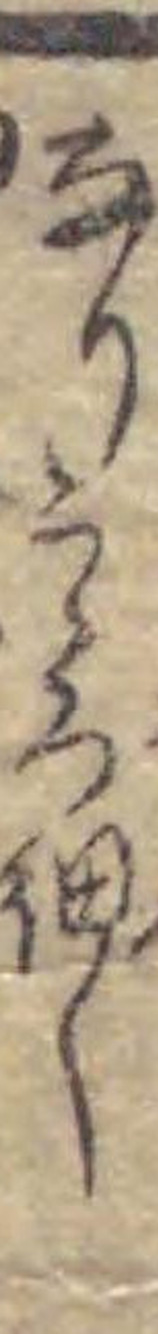なりこゝろ細く
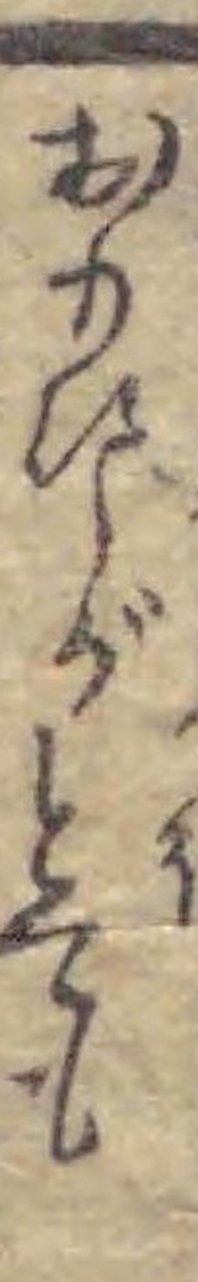おもひしがとても
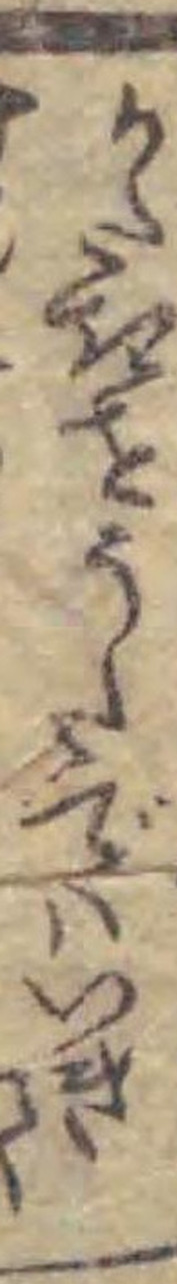かたきをうたではいきて
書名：化物世界夜半嵐 : 3巻
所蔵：国立国会図書館 National Diet Library, JAPAN
